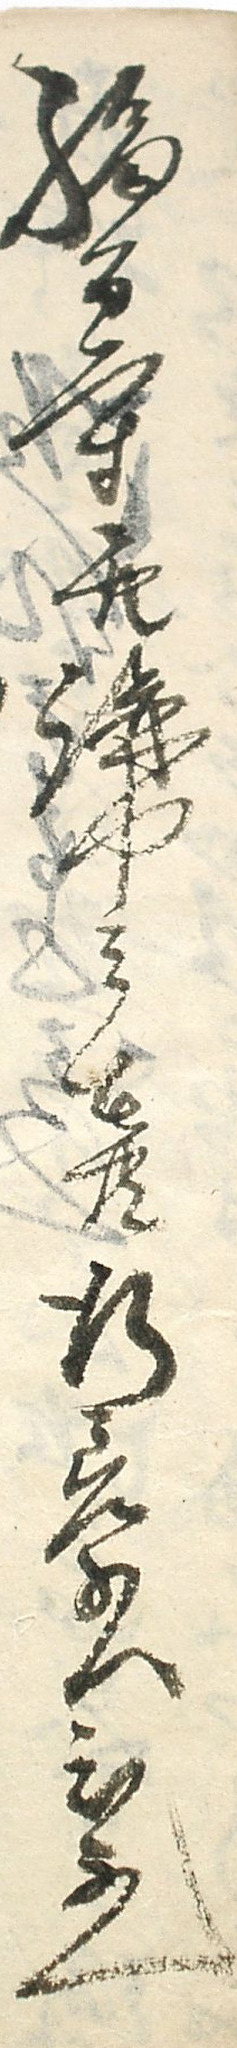福万寺幷講中之者共行着書ひかへ
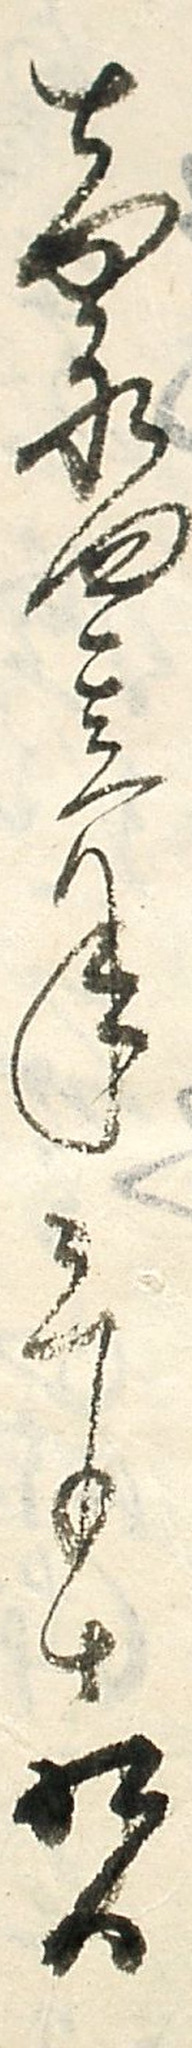嘉永四亥年三月十九日

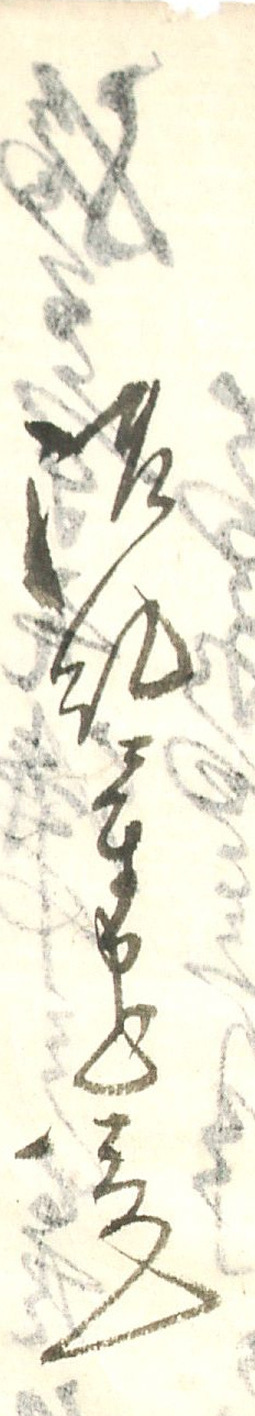御糺ニ付申上覚
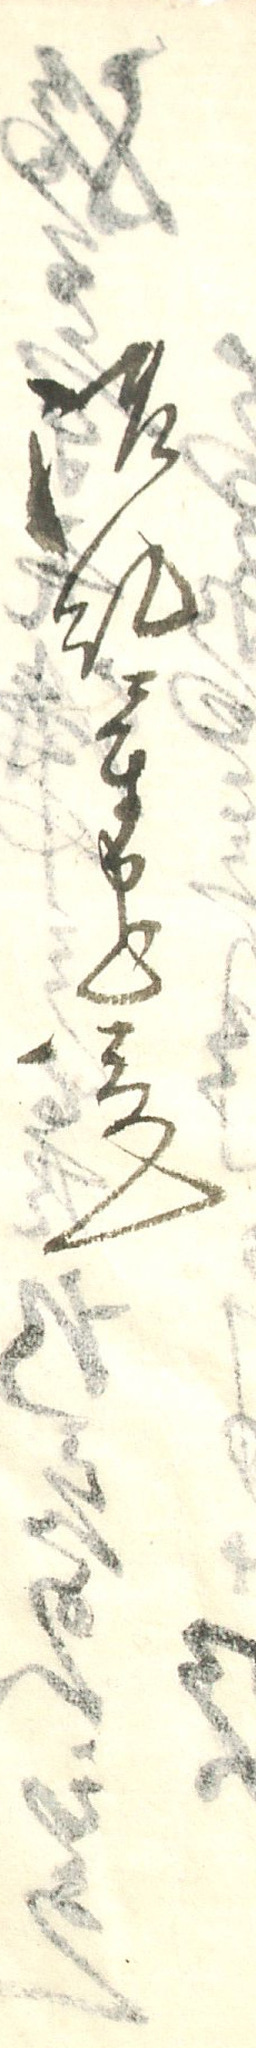御糺ニ付申上覚
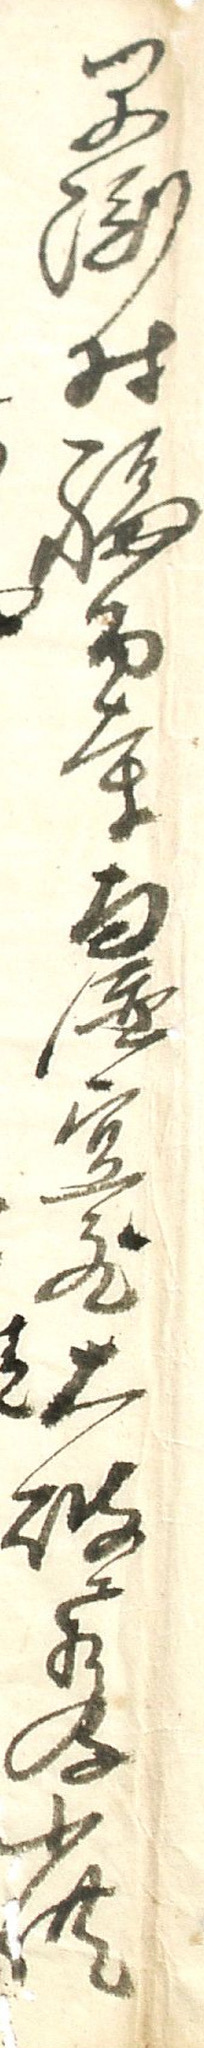早渕村福万寺虚空蔵大破ニ相及小供
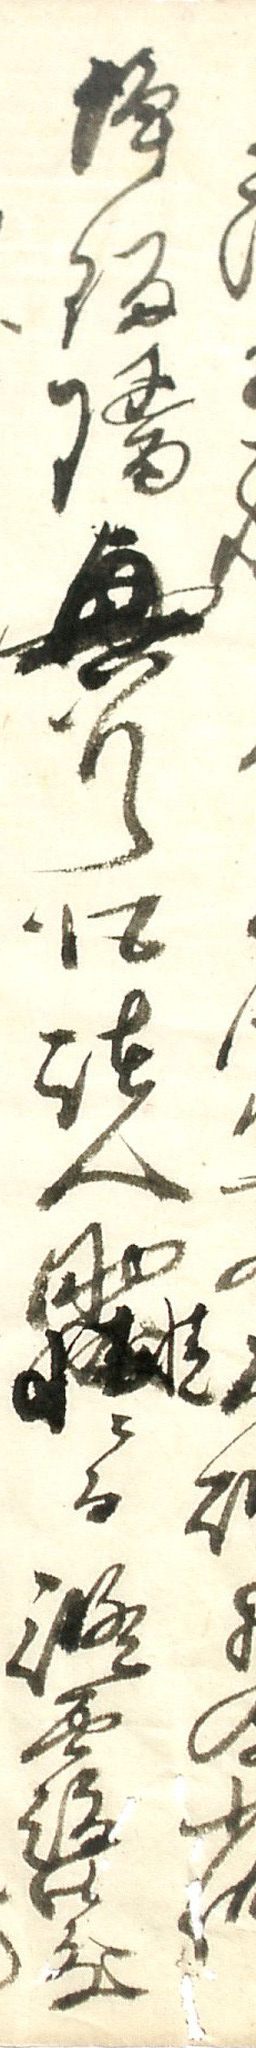浄瑠璃興行仕諸人助情ニ而修覆仕度
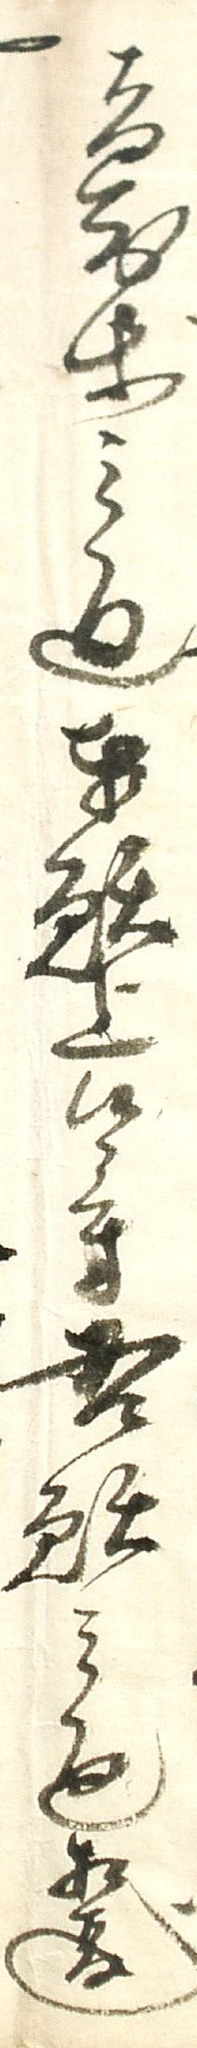旨別帋之通奉願上候ニ付右願之通相違
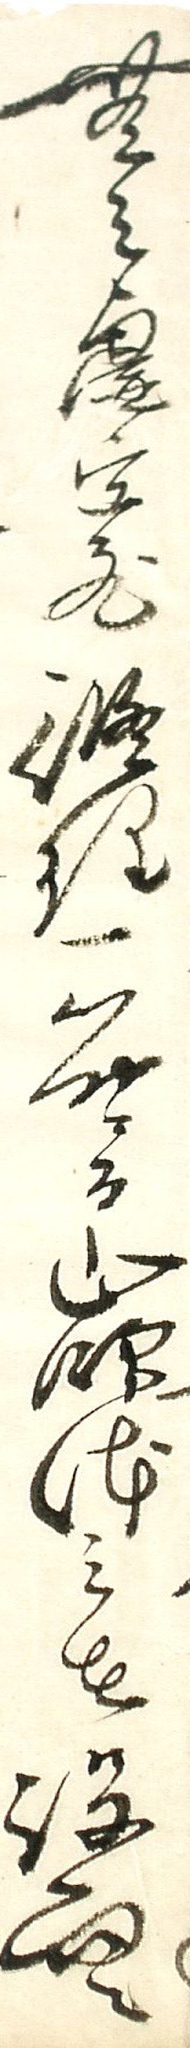無之虚空蔵修理一筋ニ而山師体之者役向ニ
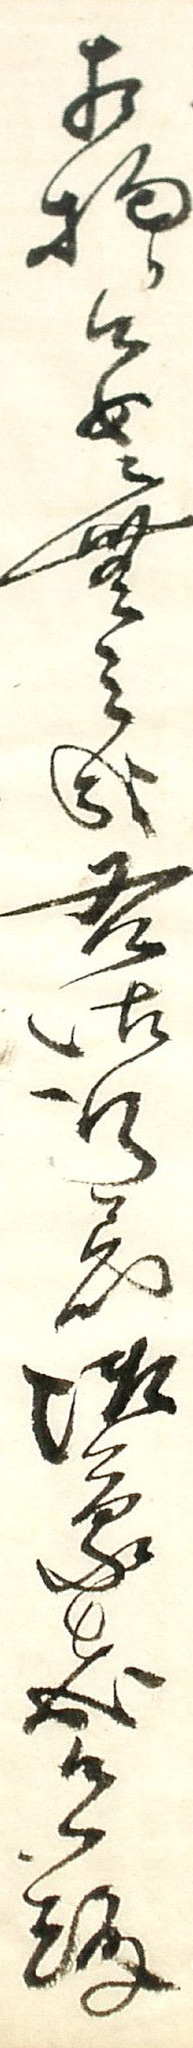相拘り候義ニ無之哉右御行着御蒙被成候御趣
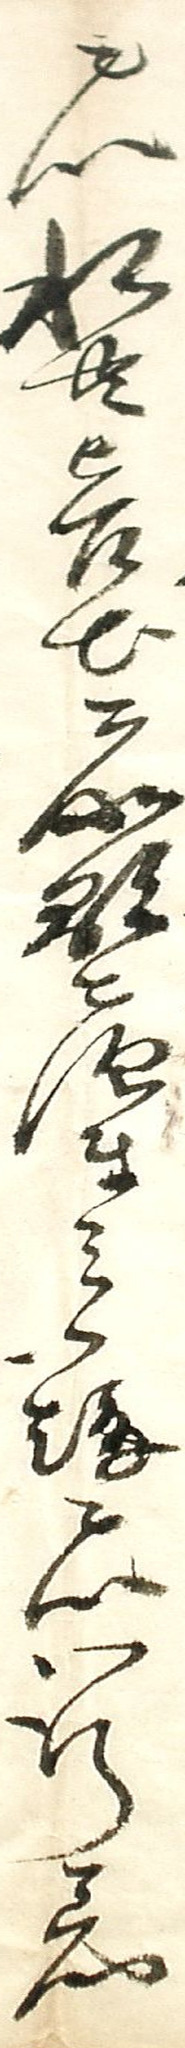を以私共被召出前顕被仰付之御趣を以御行着
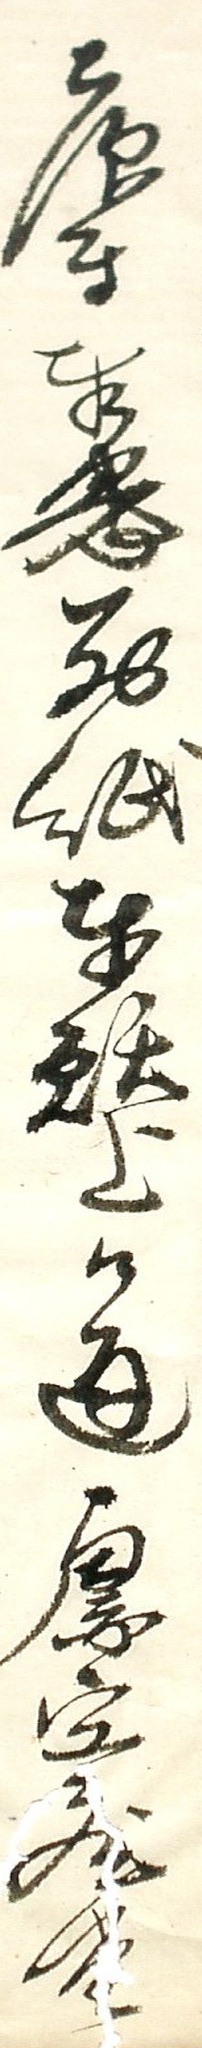被仰付奉畏別紙奉願上候通虚空蔵堂
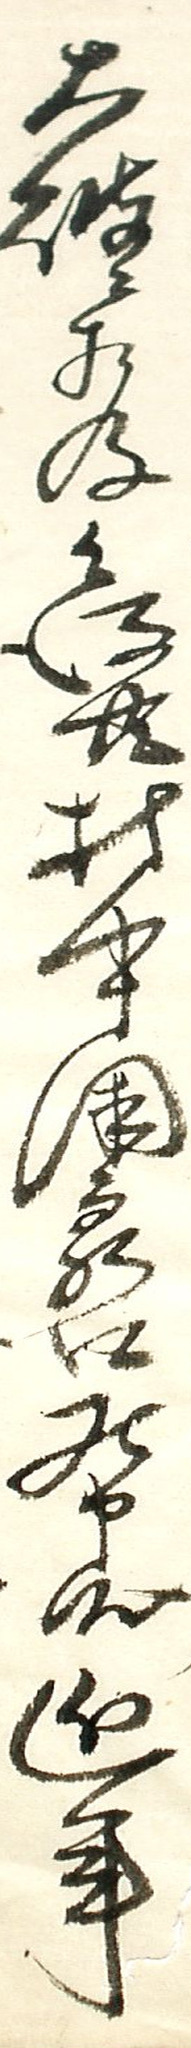大破ニ相及候得共村中困窮仕居申所近年
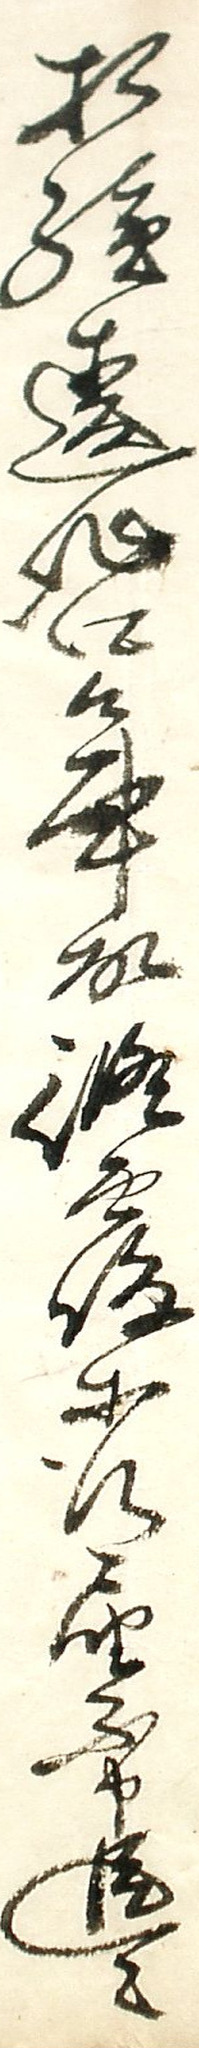打続違作仕候事故修覆等行届不申追々
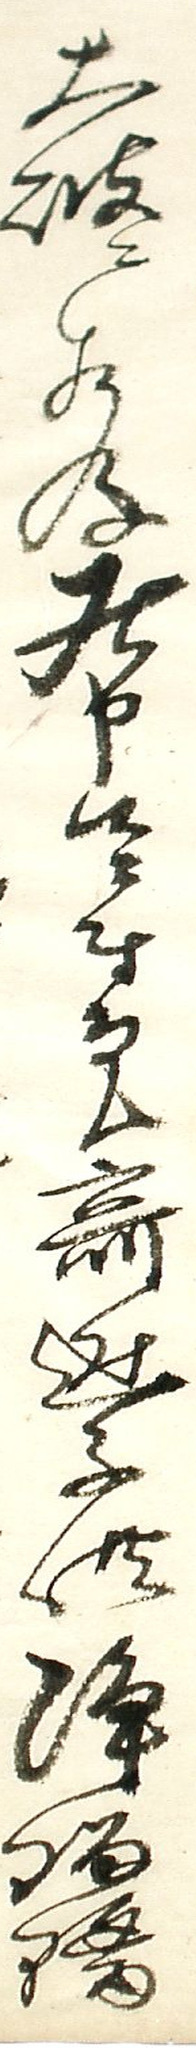大破ニ相及居申候ニ付而ハ竒進子供浄瑠璃
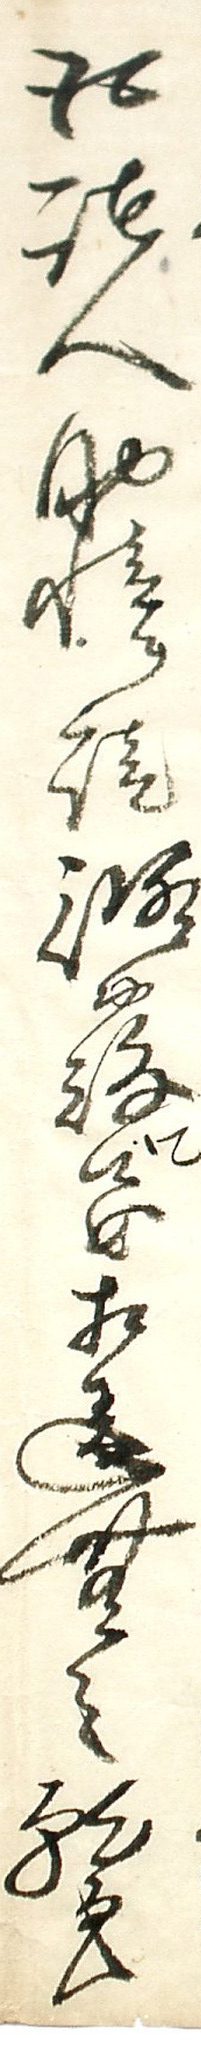仕諸人助情ヲ請修覆仕候義相違無之就而ハ
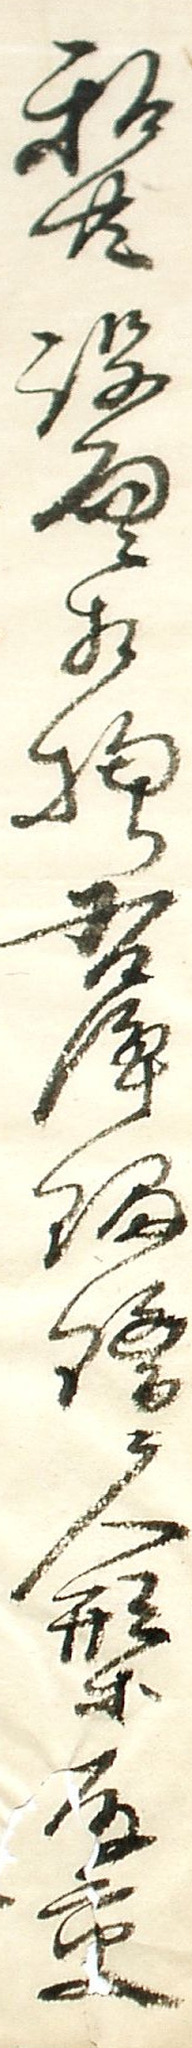私共役向ニ相拘り右浄瑠璃ニ人形等取交
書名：(早渕村福満寺子ども浄瑠璃願紙面）他
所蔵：鳴門教育大学 Naruto University of Education
